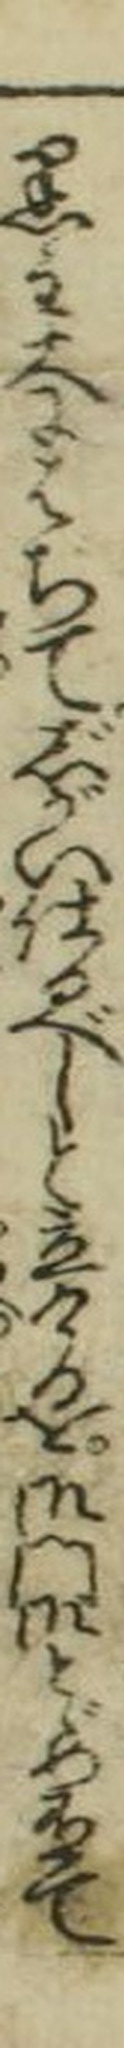黒主大にはちて。じがい仕るべしと立けるを。御門御とゞめ有て
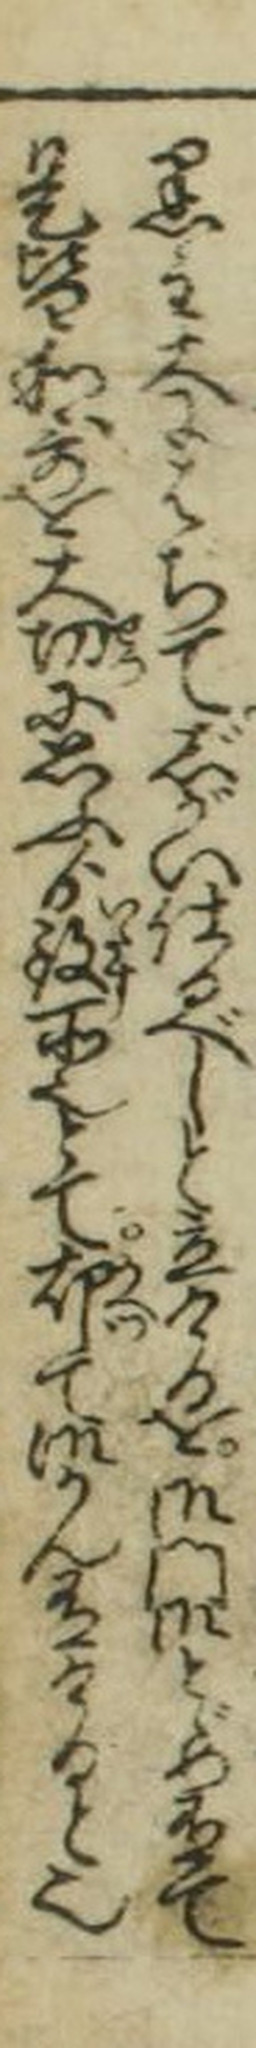是皆和哥を大切に思ふより致所也とて。却て御かん有けると也

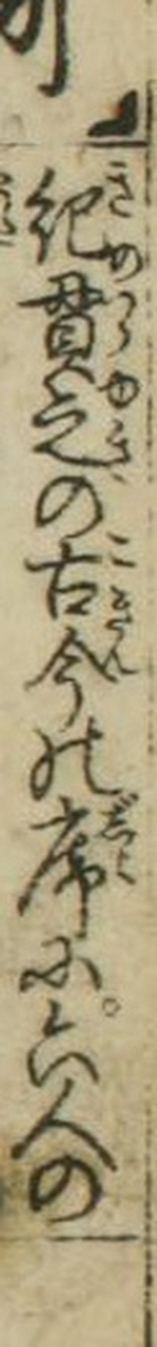紀貫之の古今の序に。六人の
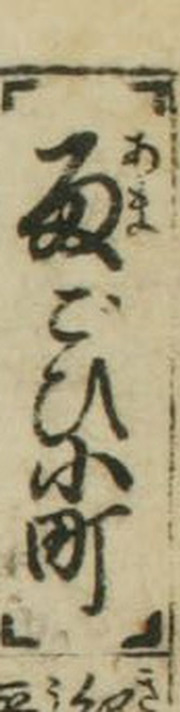雨ごひ小町
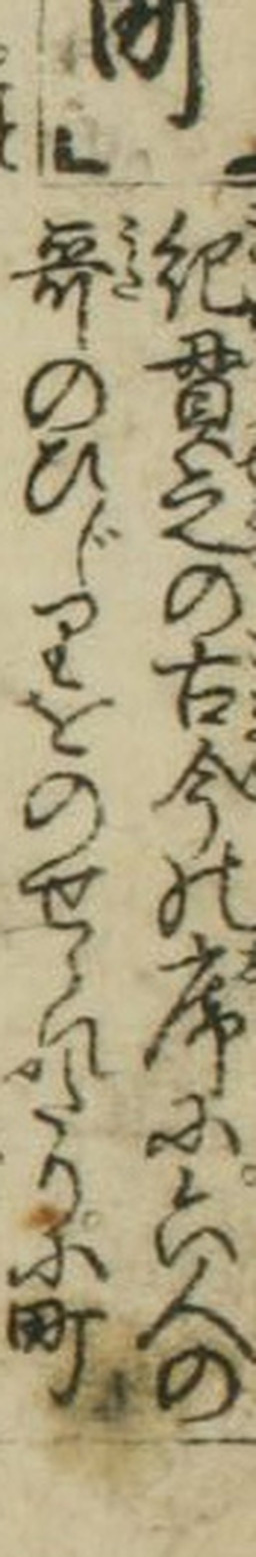哥のひじりをのせられたり。小町
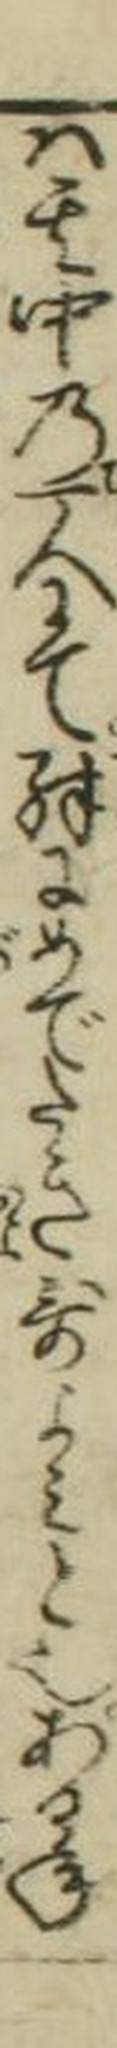は其中の一人にて。殊にめでたき哥よみと也。ある年
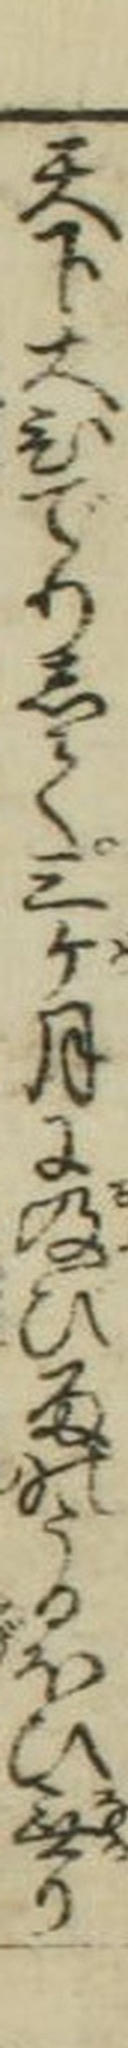天下大ひでりして。三ヶ月に及ひ雨のうるほひ無り
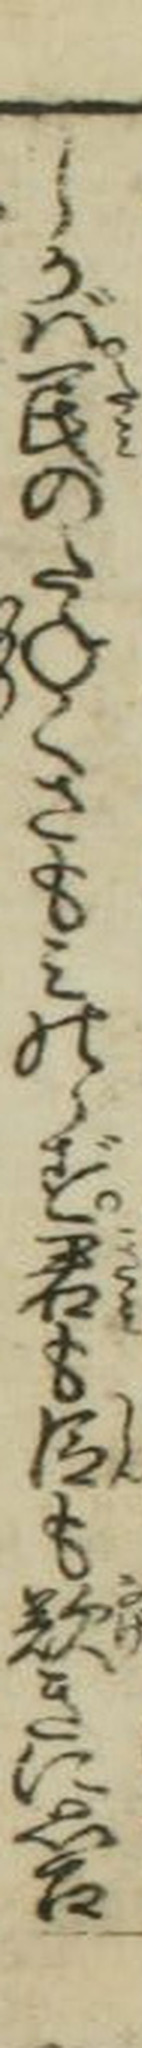しかば。民のたねくさもみのらず。君も臣も歎きに思召
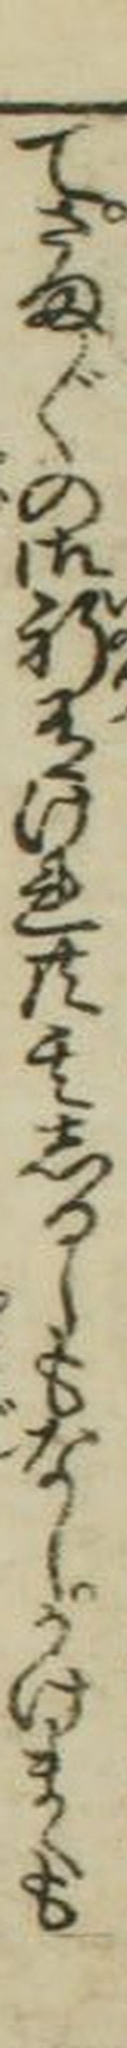て。さま〴〵の御祈有けれ共其しるしもなし。かけまくも
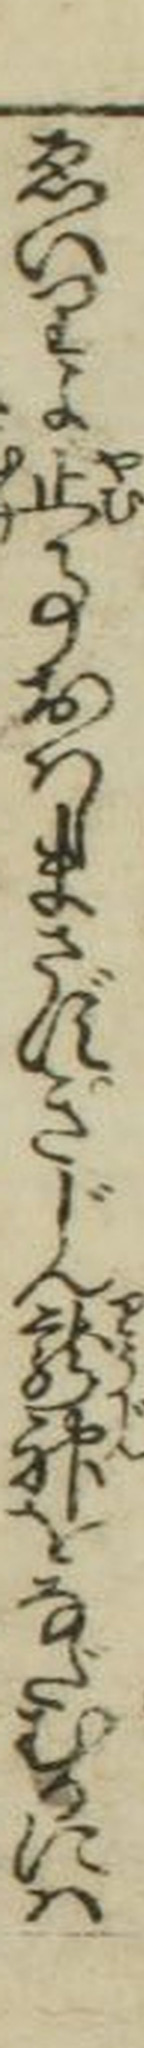ゑいりよ止事おはしまさず。きじん龍神をなだむるには
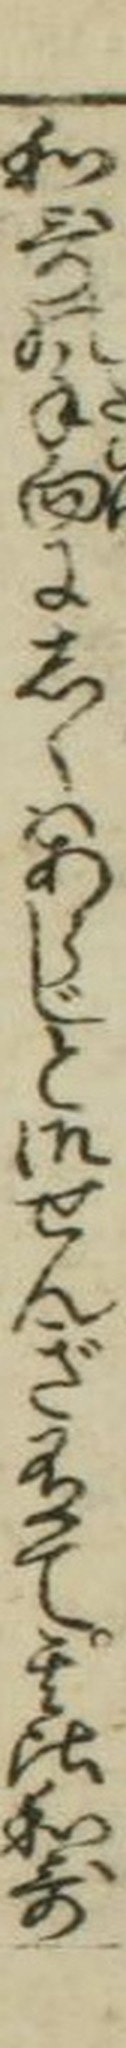和哥の手向にしくはあらじと御せんぎ有て。其比和哥
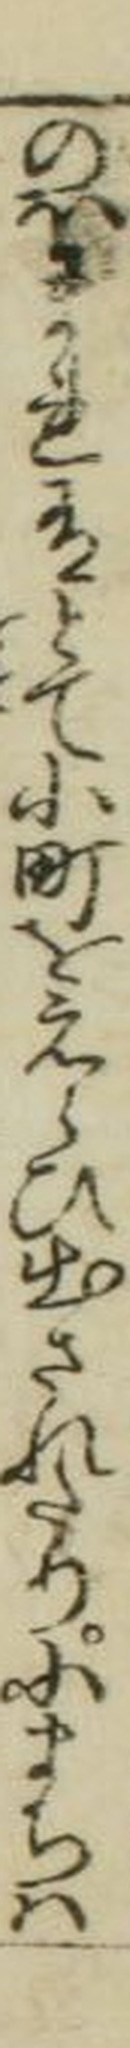のほまれ有とて小町をえらひ出されたり。小まちは
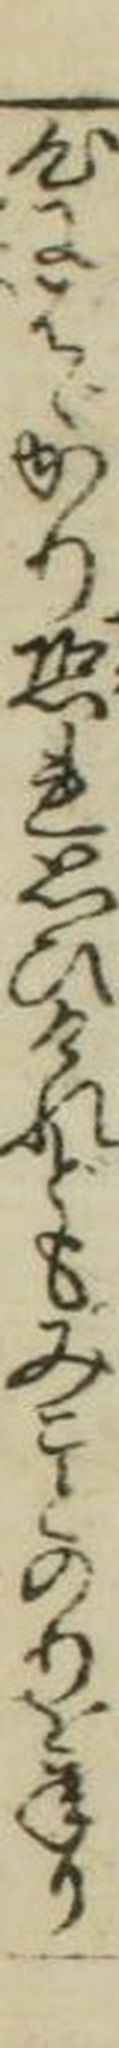心にはゞかり恐れ思ひけれども。みことのりを承り
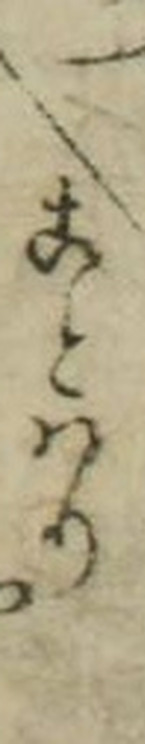ことはりや
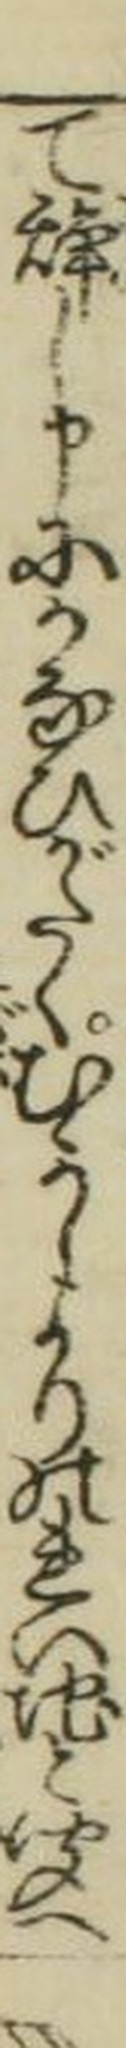て辞し申にかなひがたく。むかしよりのれい地と聞へ
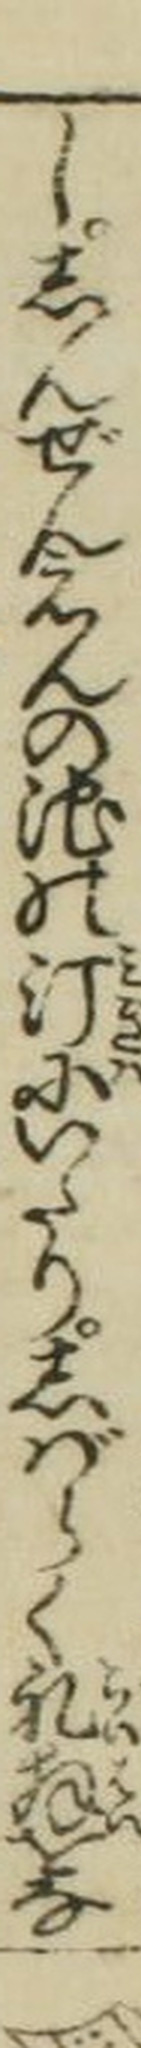し。しんぜんえんの池の汀にいたり。しばらく礼拝をな
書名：女源氏教訓鑑
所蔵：東京学芸大学附属図書館
